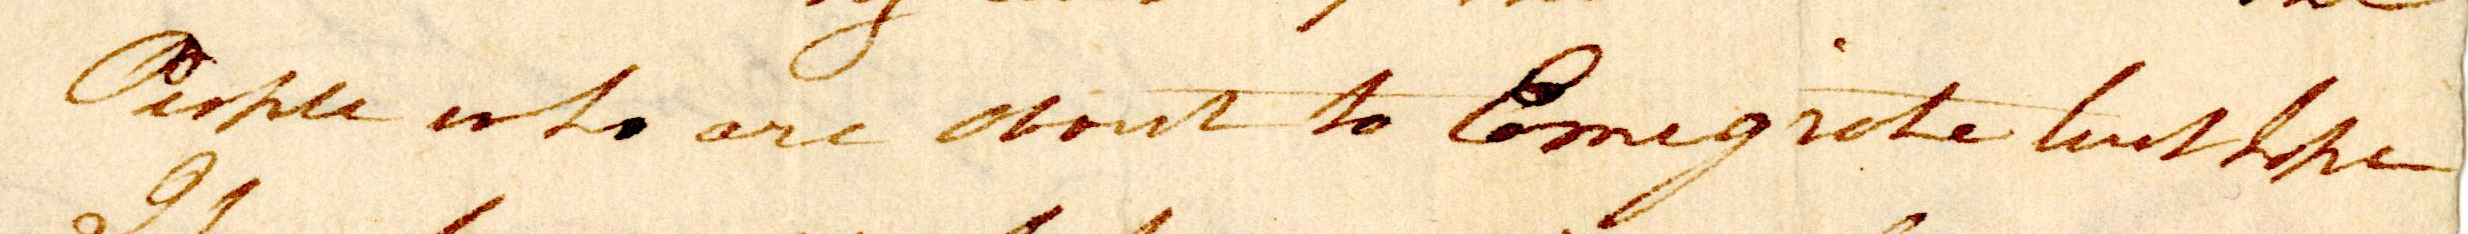People who are about to Emigrate but hope
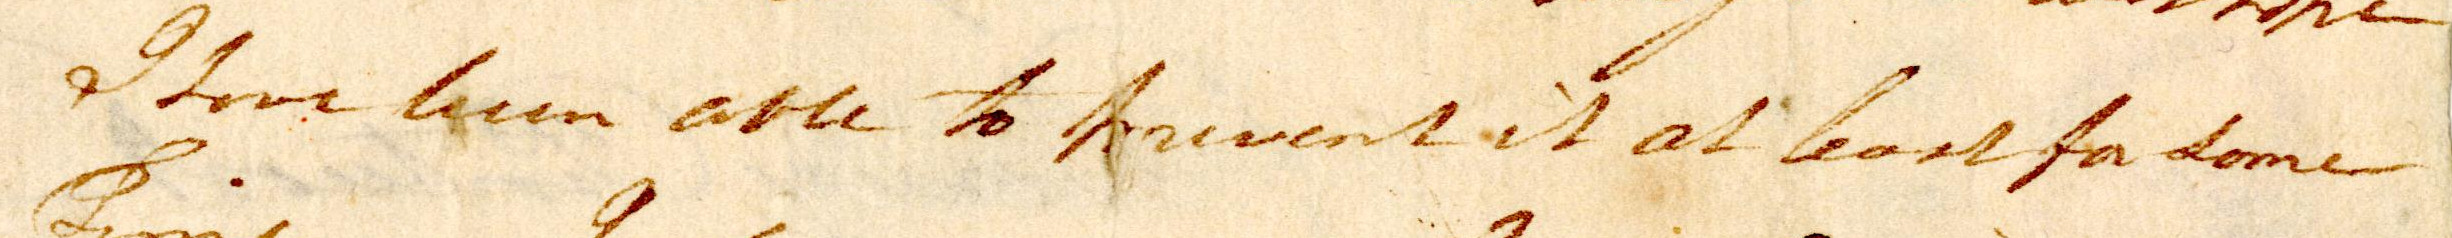I have been able to prevent it at least for some
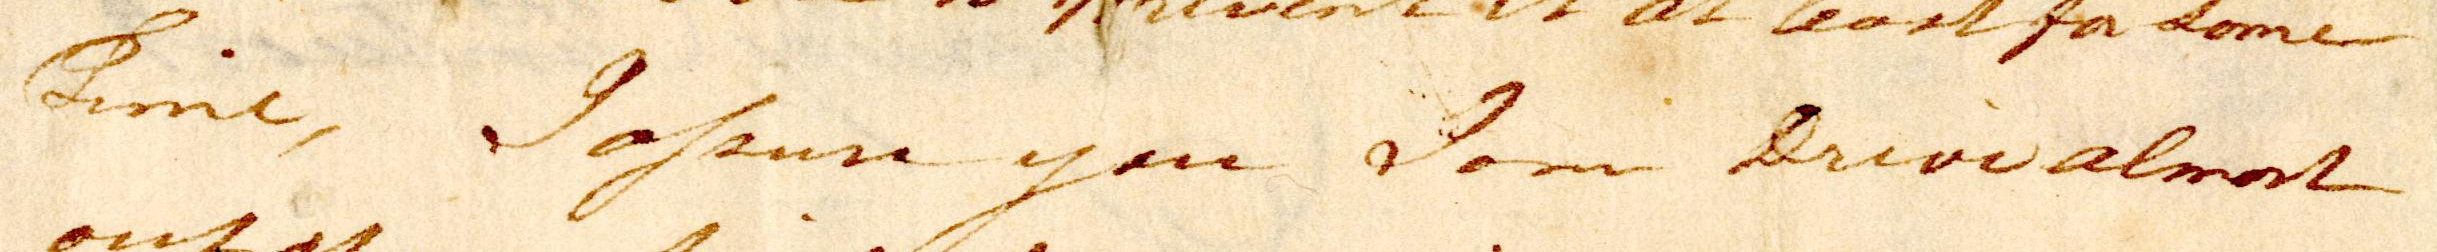Time, I assure you I am Drive almost
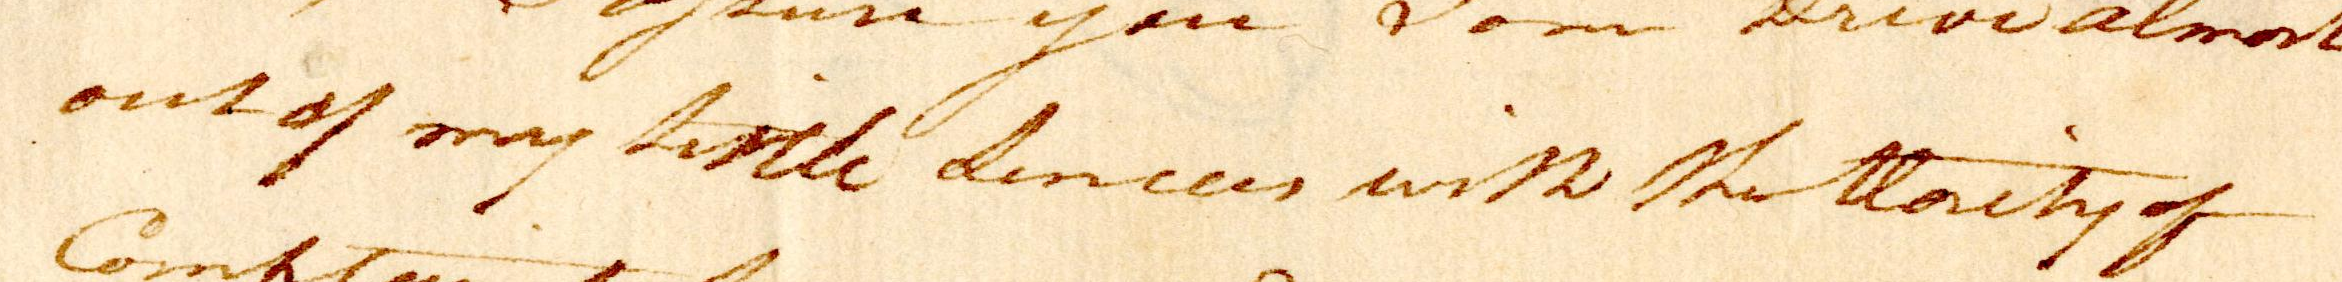out of my little sences with the stoity of
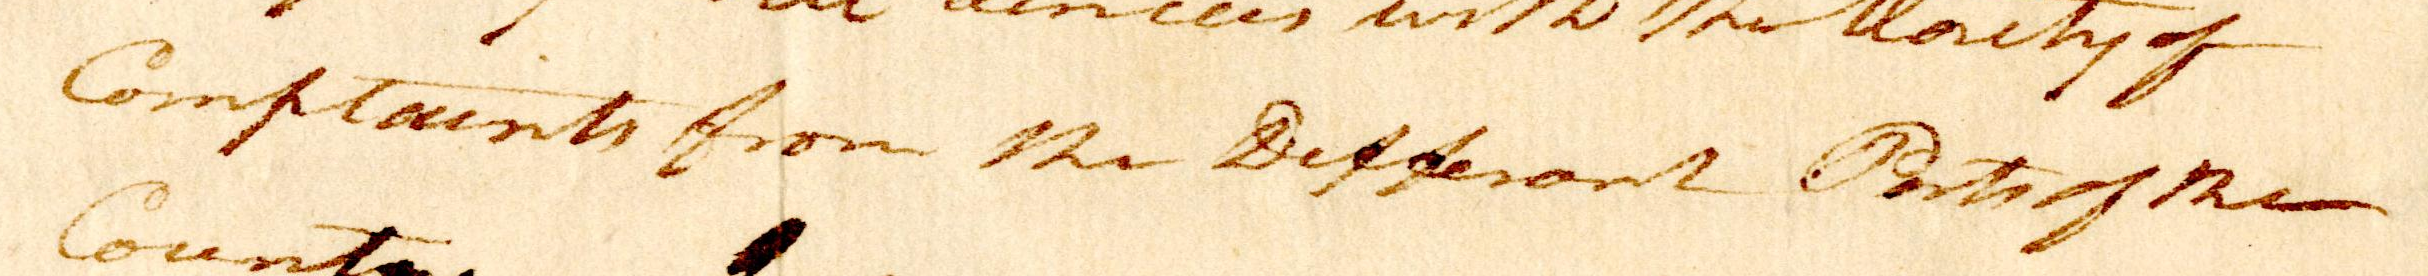Complaints from the Differant Parts of the
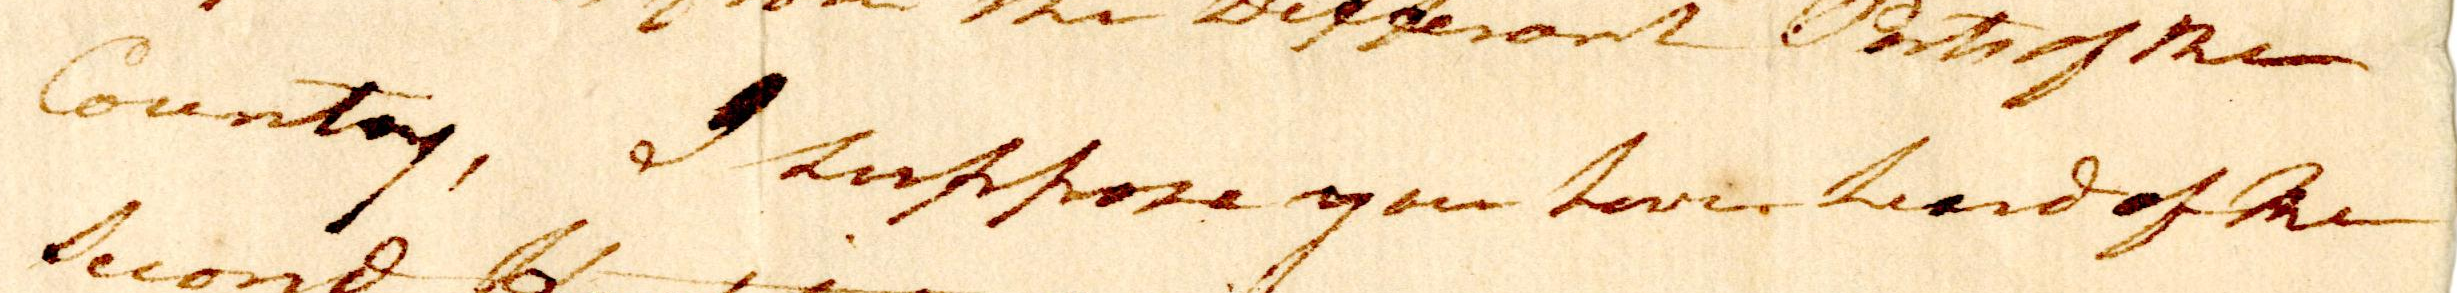Country, I suppose you have heard of the
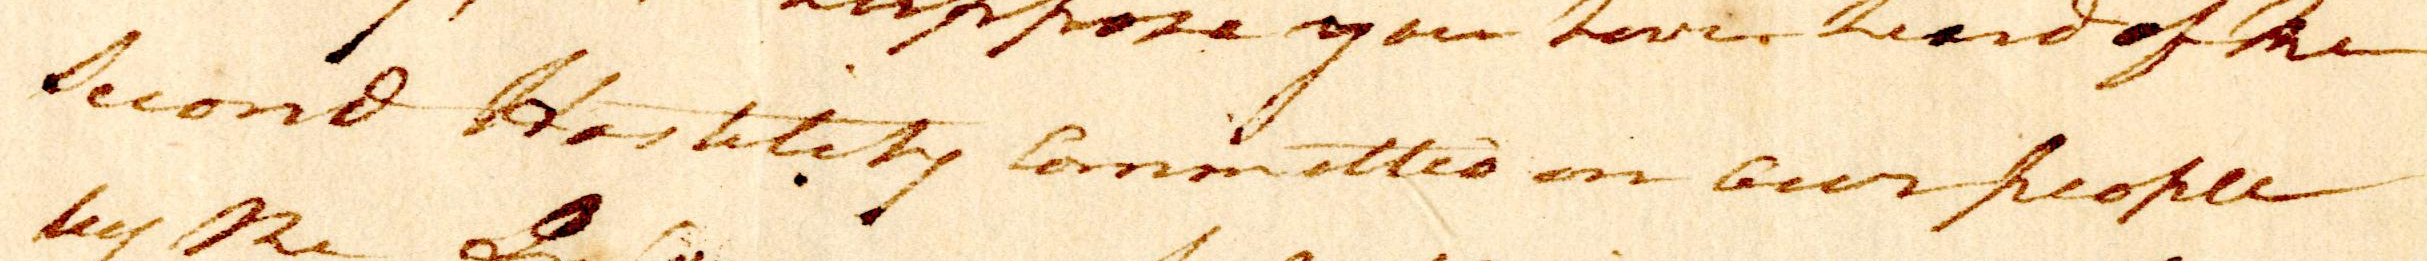second Hostility Committed on our people
